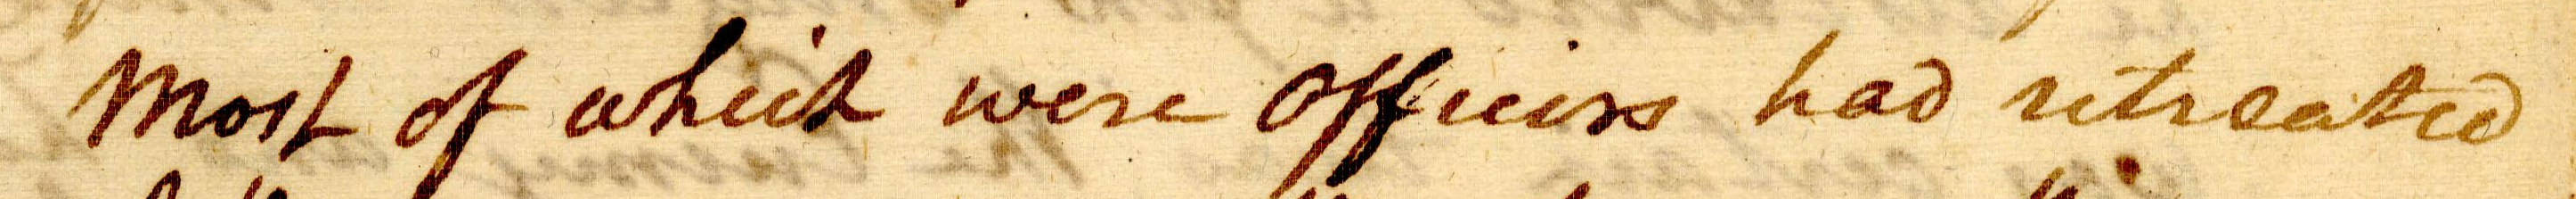most of which were officers had retreated
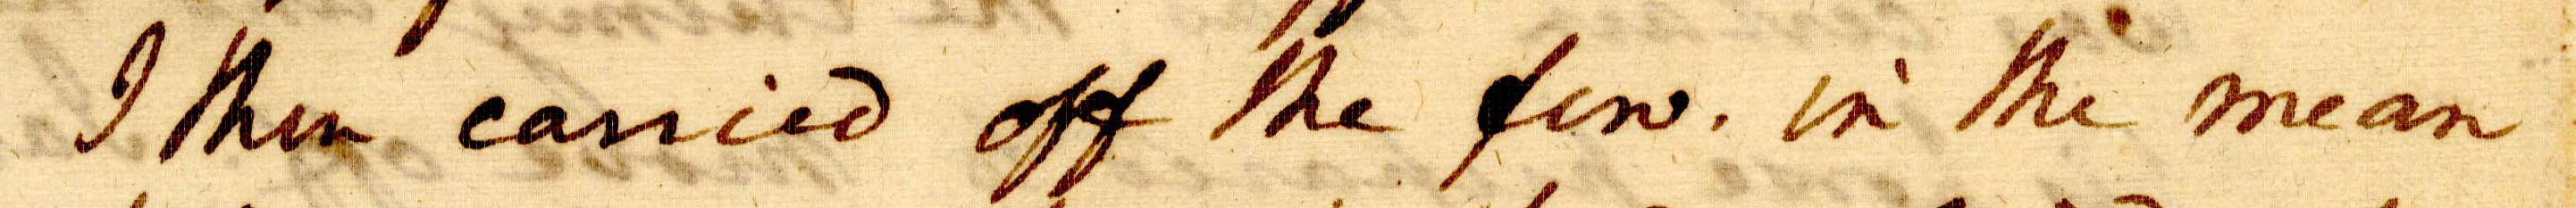I then carried off the few in the mean
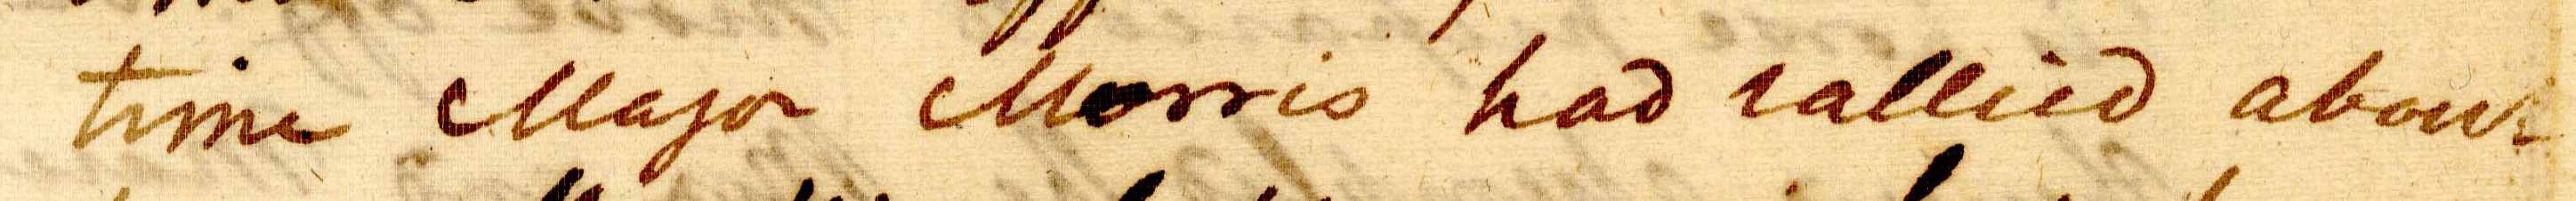time Major Morris had rallied about
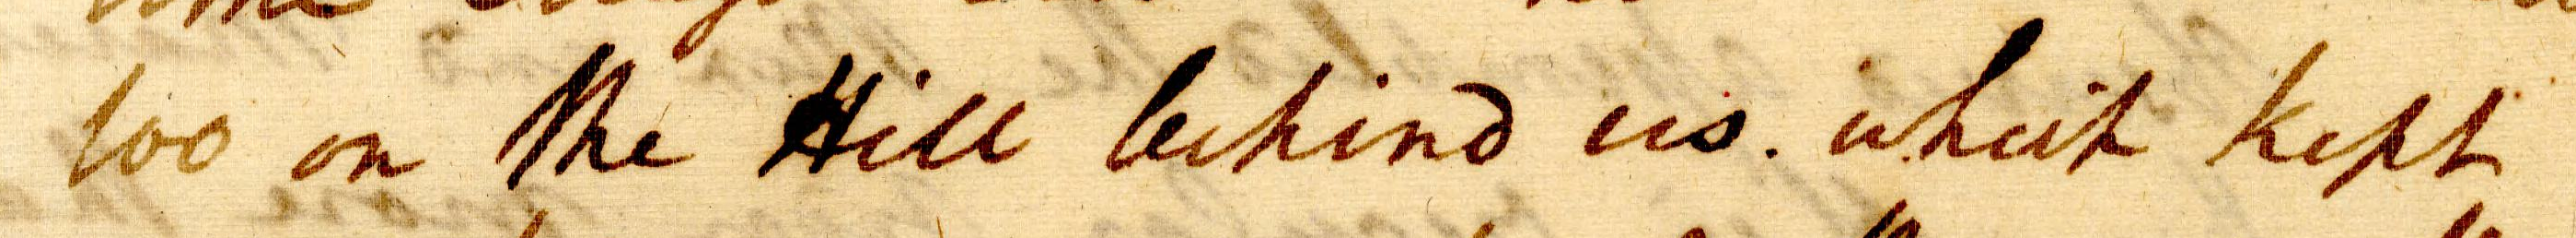100 on the Hill behind us which kept
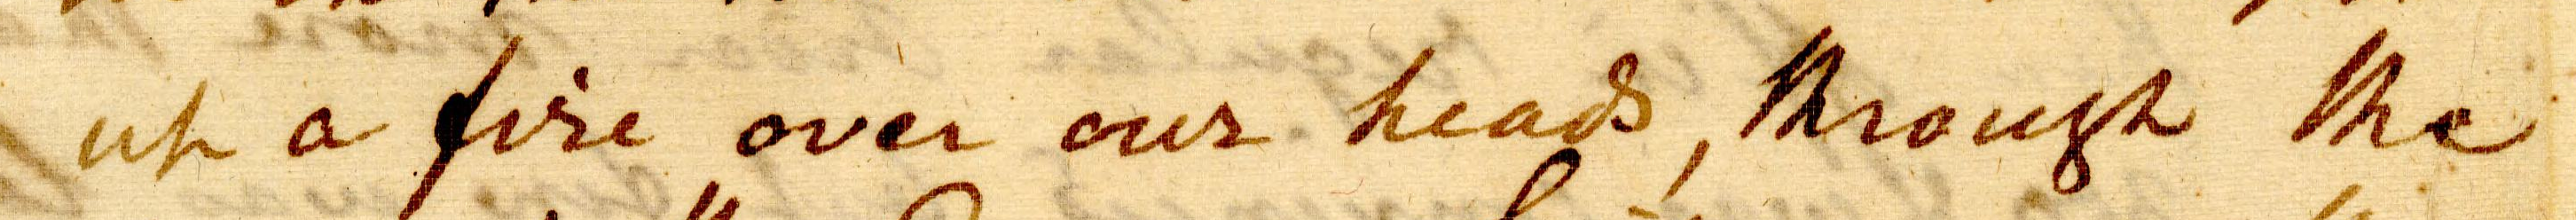up a fire over our heads, through the
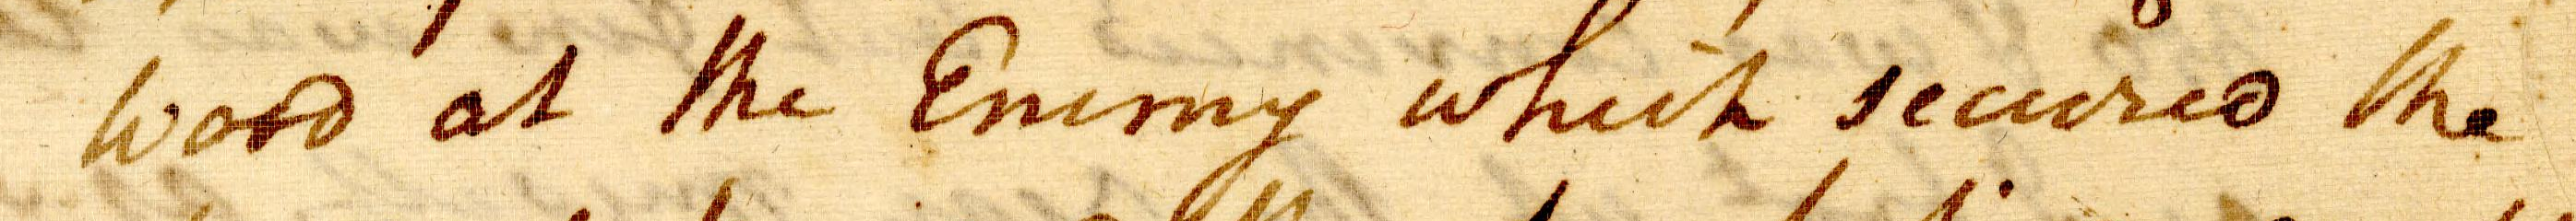word at the Enemy which secured the
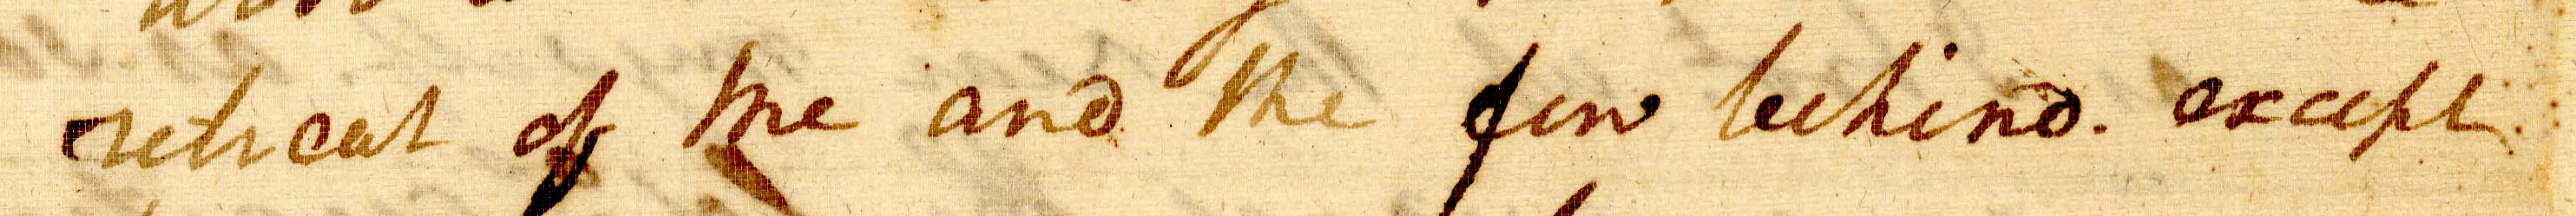retreat of me and the few behind except
